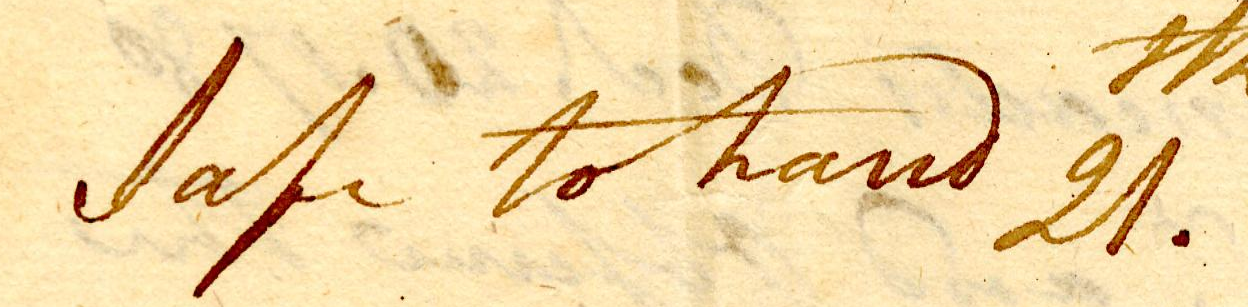Safe to hand 21^th.
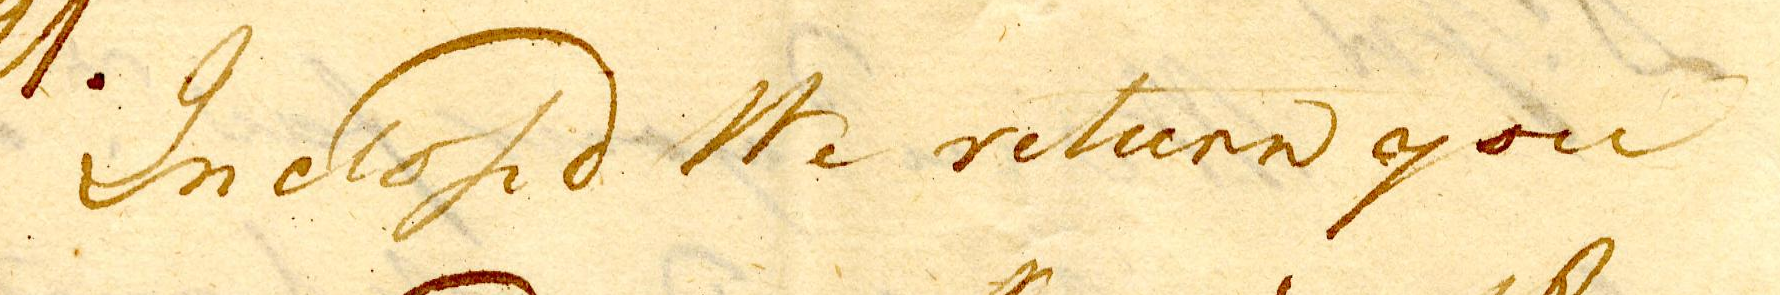Inclosd We return you
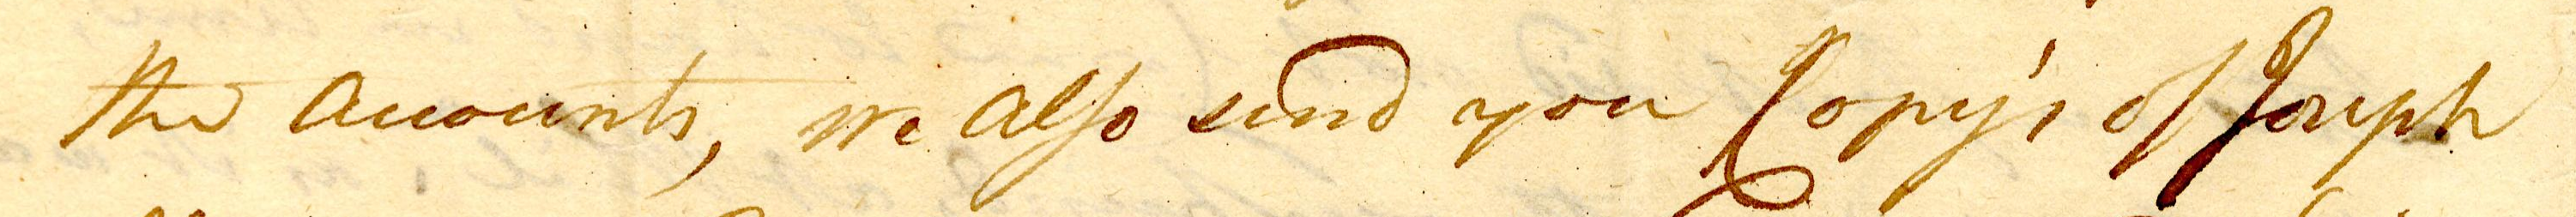the Accounts, we also send you Copy's of Joseph
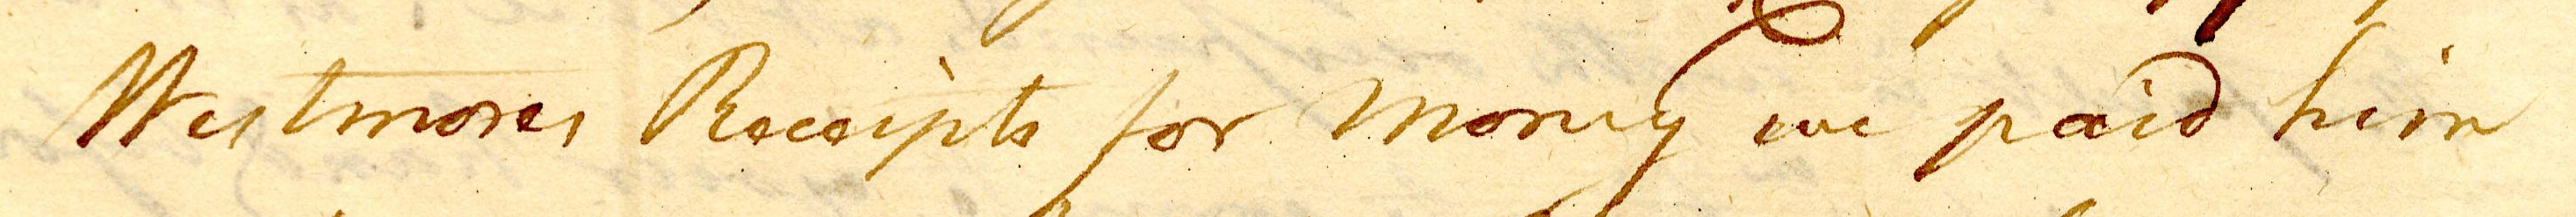Westmores Receipts for money we paid him
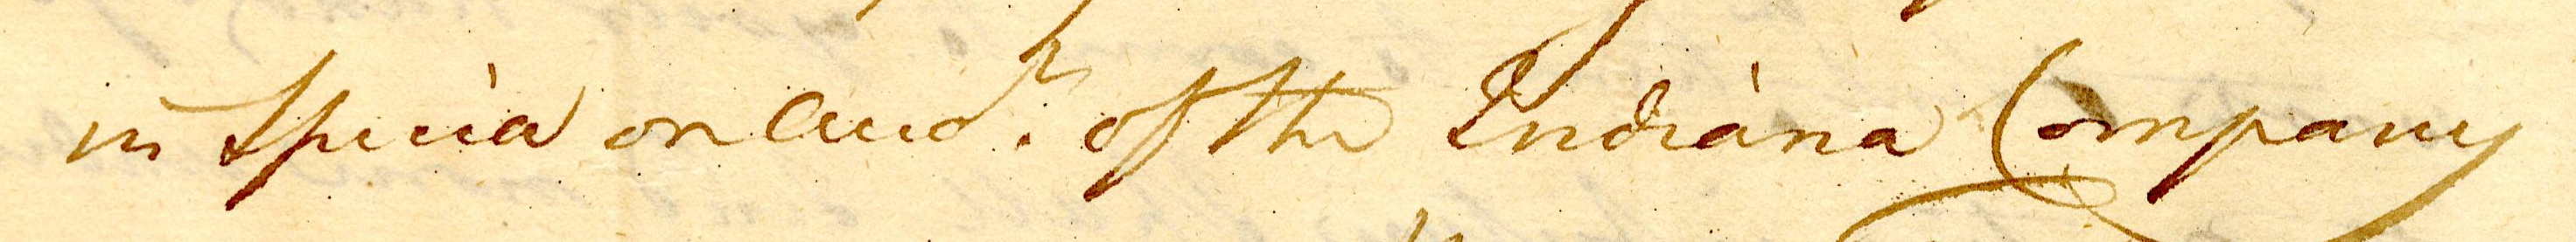in special on acco^t. of the Indiana Company
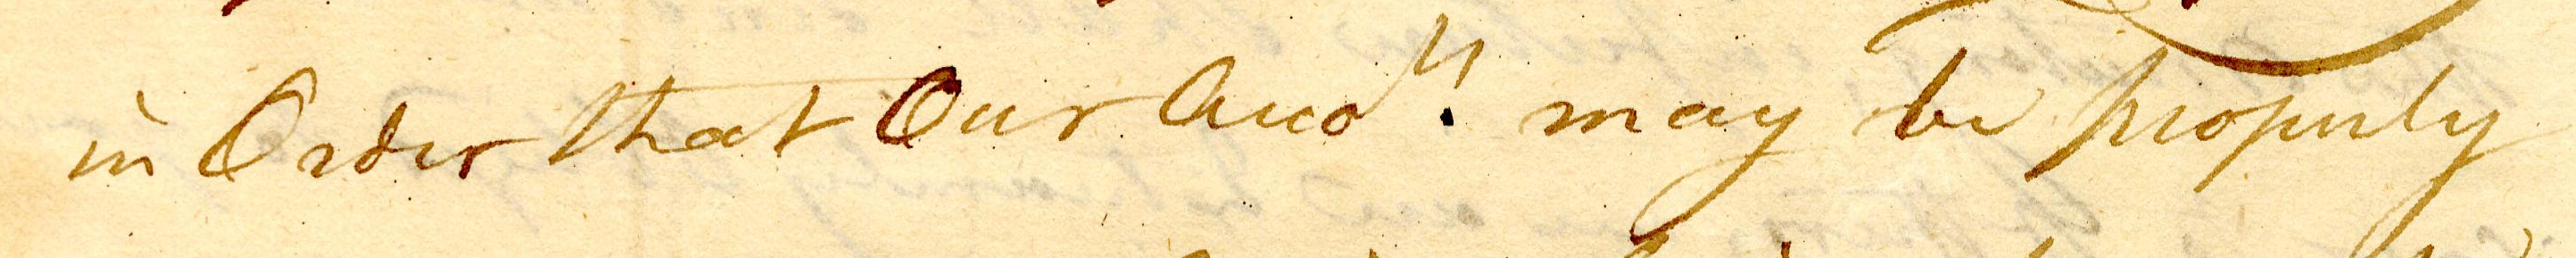in Order that Our Acco^t. may be properly
